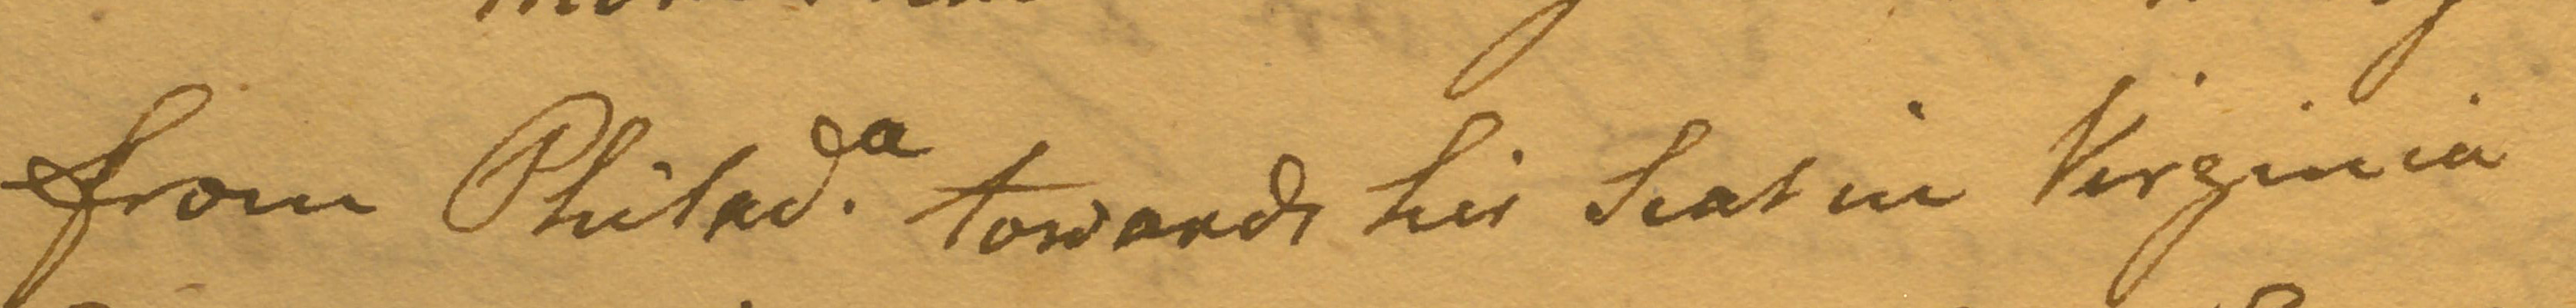from Philad^a. towards his Seat in Virginia
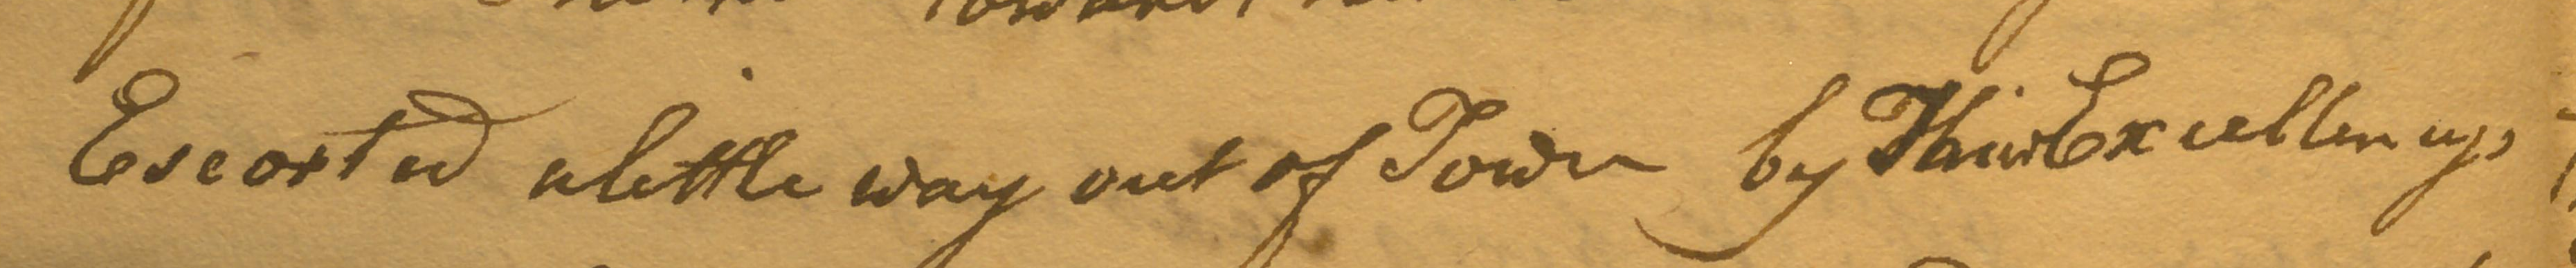Escorted a little way out of Town by This Excellencys
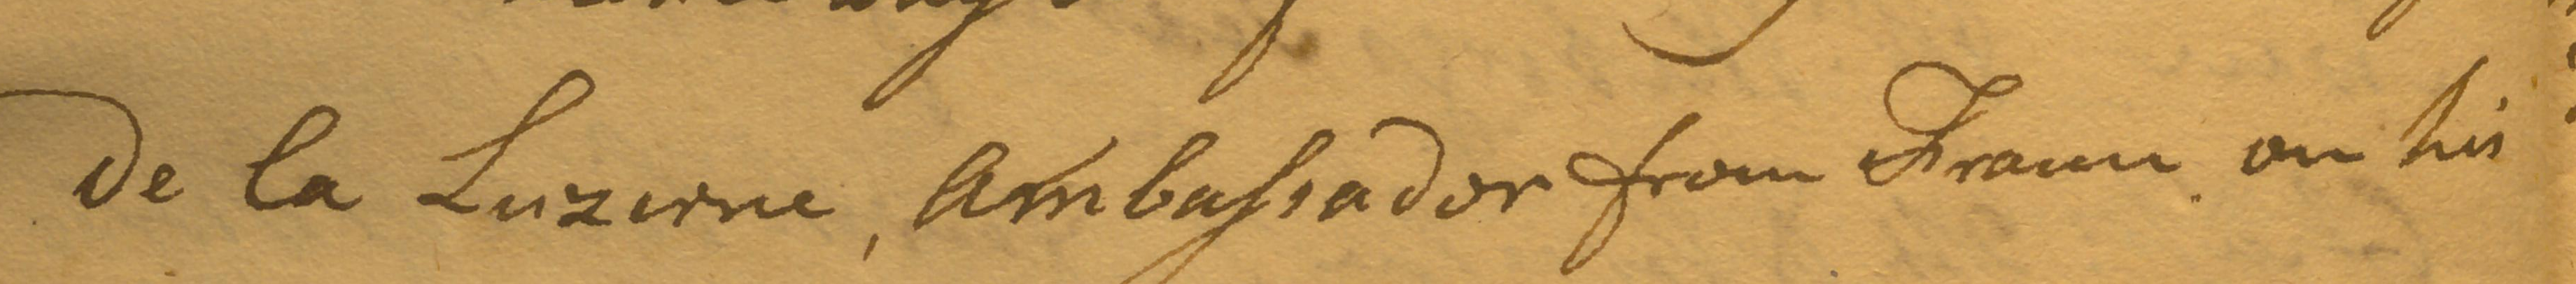de la Luzerne Ambassador from France on his
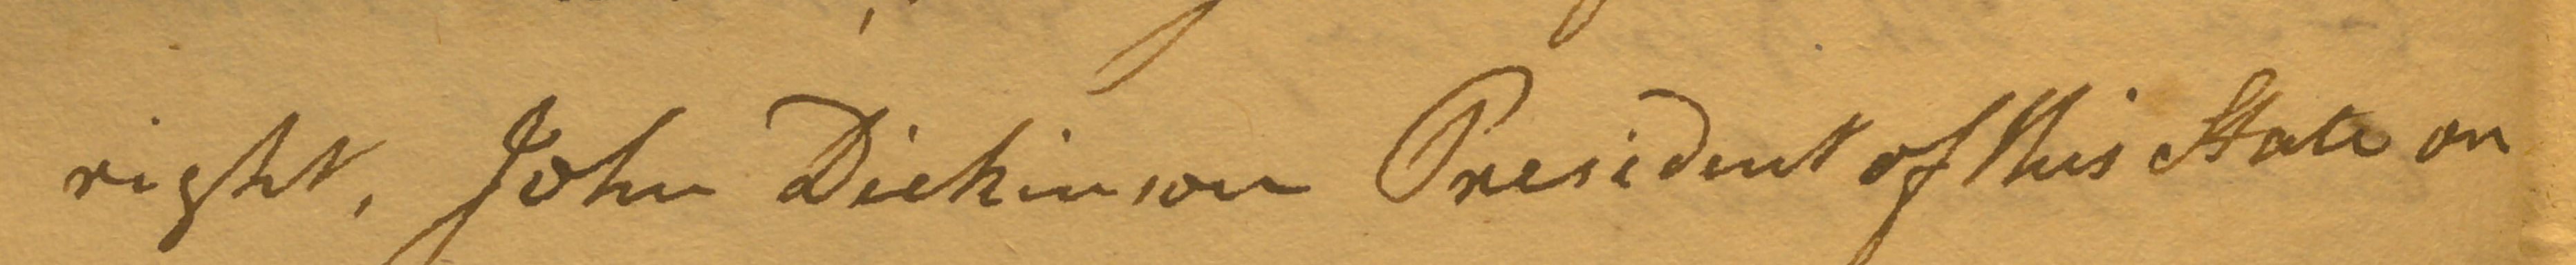right, John Dickinson President of this State on
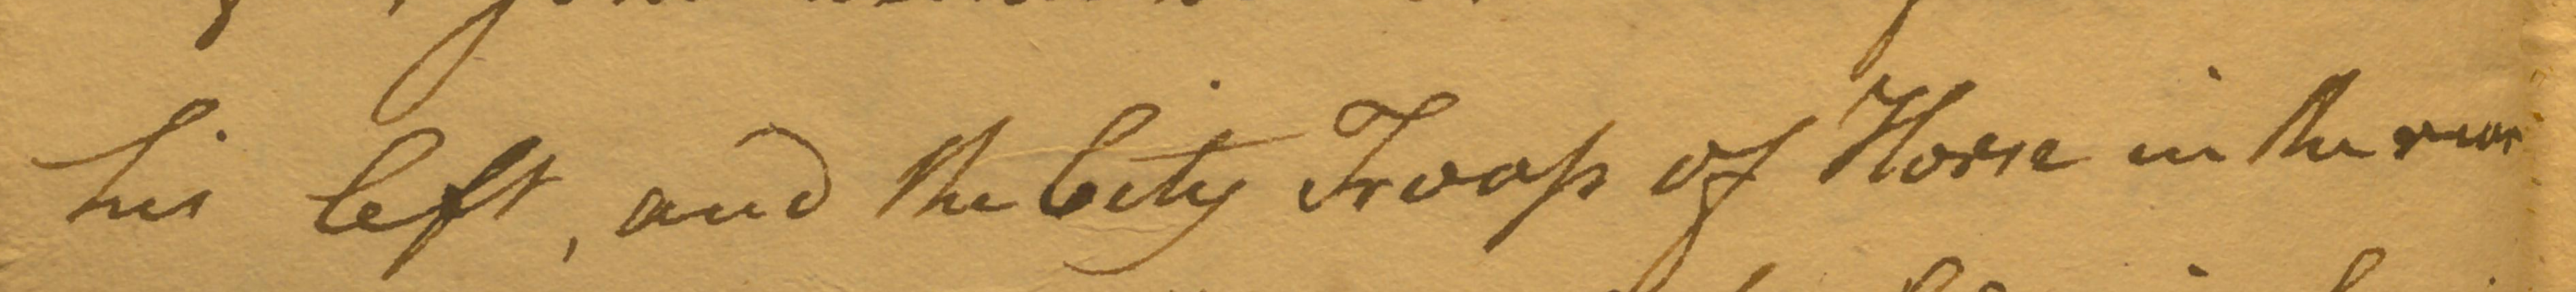his left and the City Troop of Horse in the rear
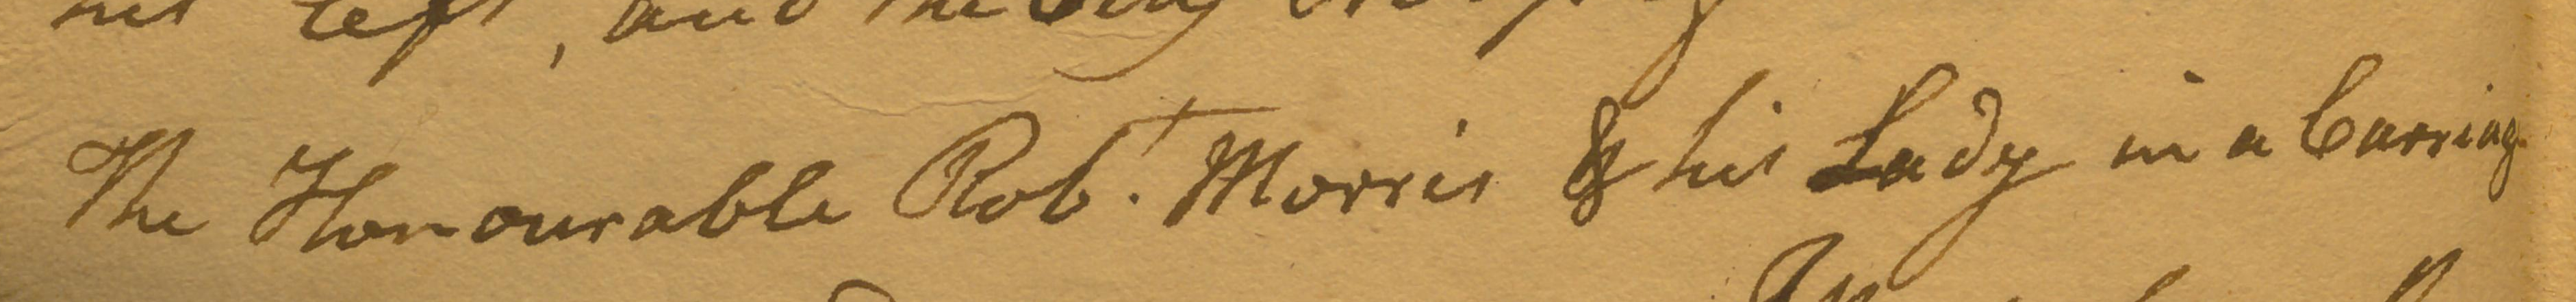The Honourable Rob^t. Morris & his Lady in a Carriage
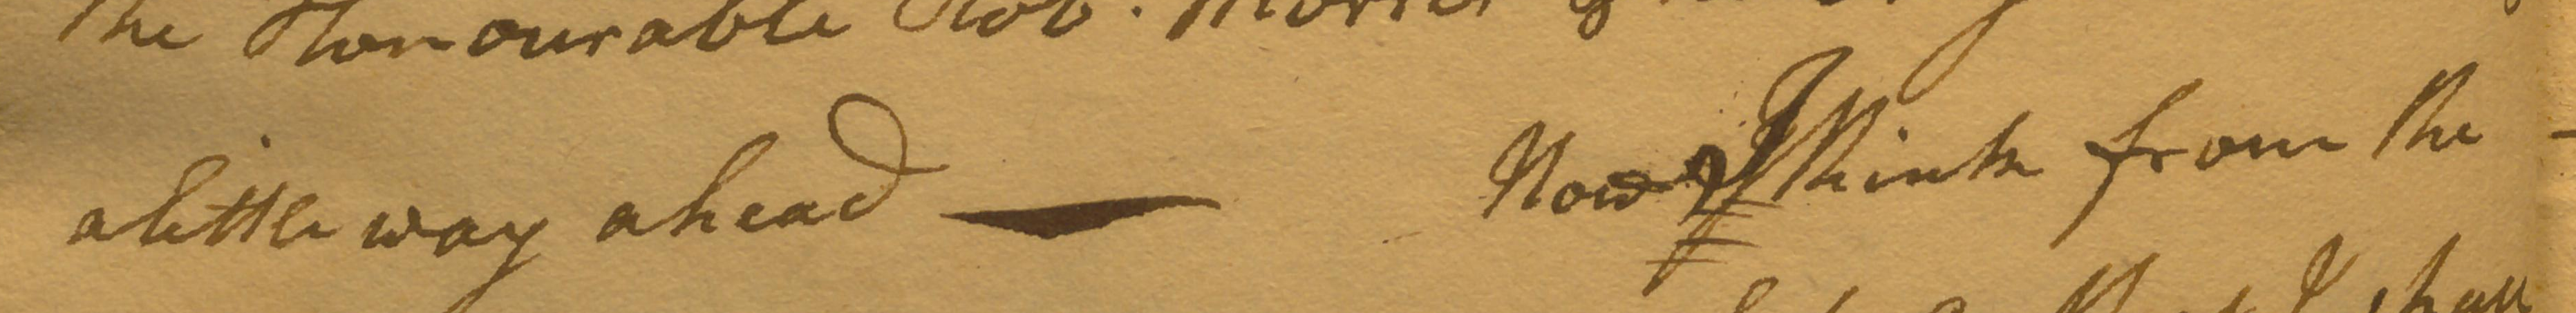a little way a head- Now I think from the
